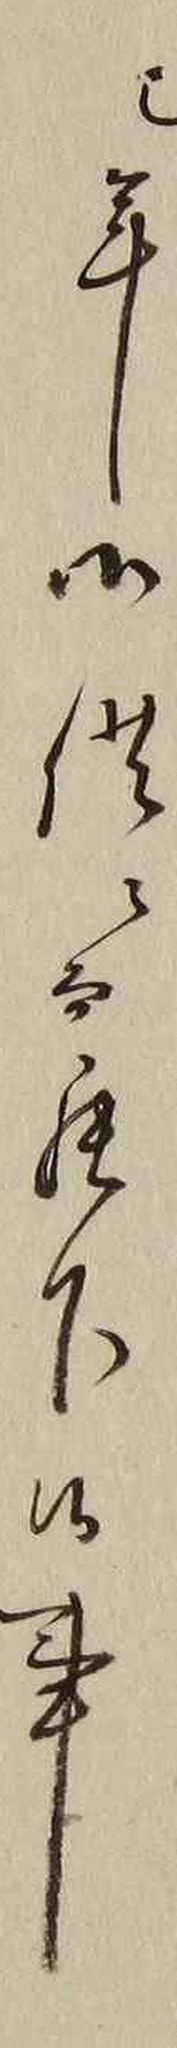巳年御供に而罷下候事
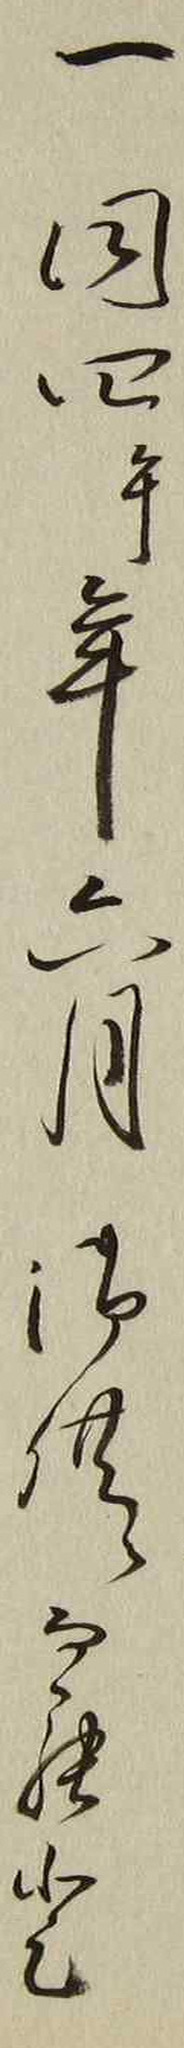一同四午年六月御供に而罷登
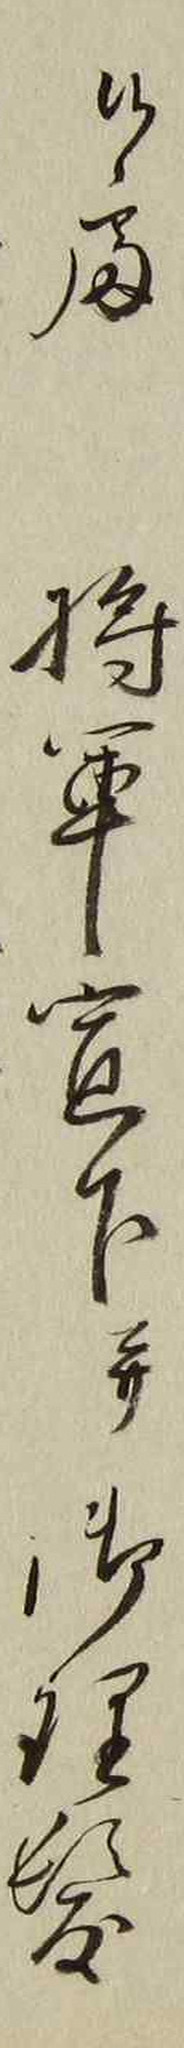候処将軍宣下幷御理髪
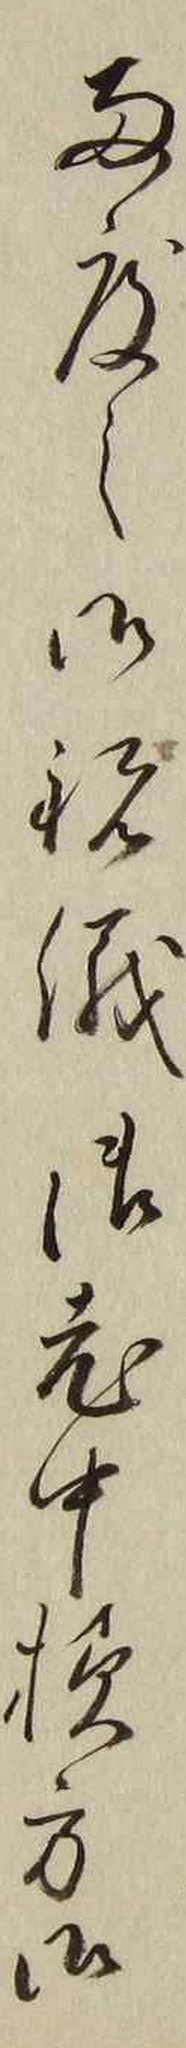両度之御祝儀御老中様方御
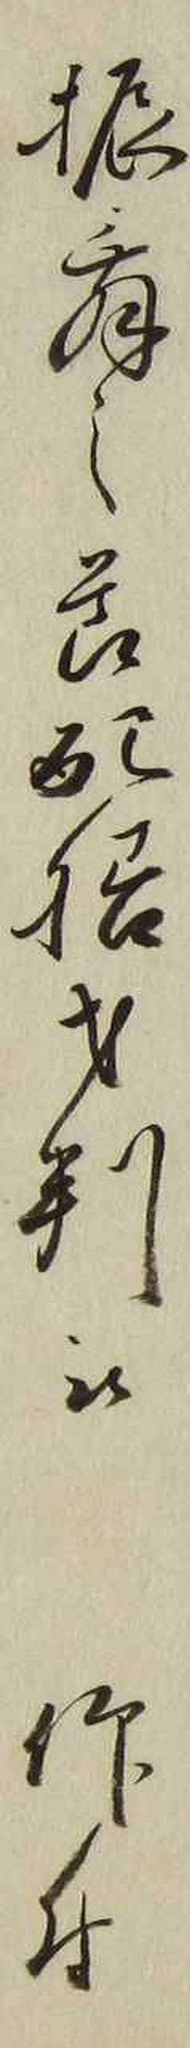振舞之節配膳才判被仰付

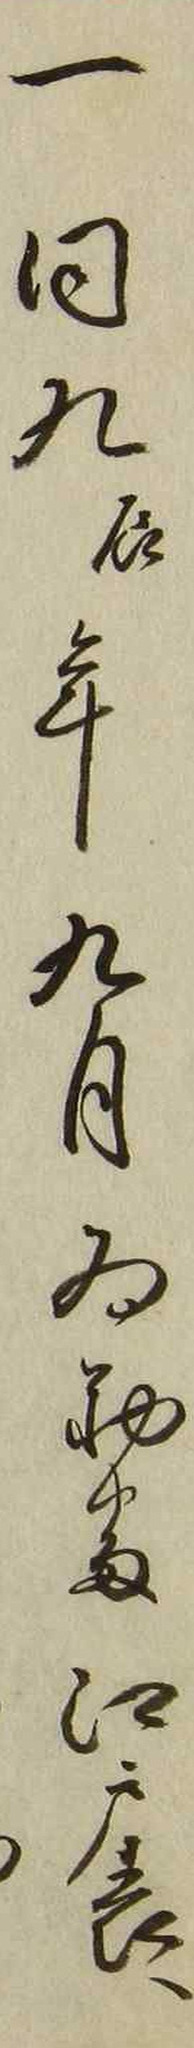一同九辰年九月為勤番江戸表へ
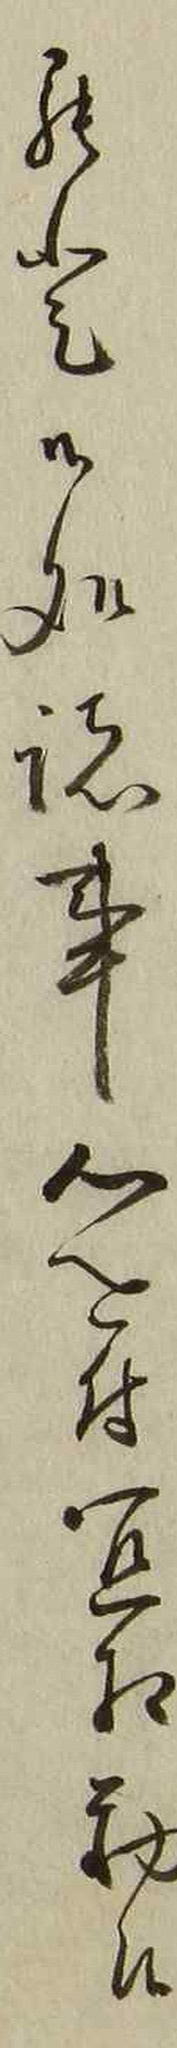罷登候所諸事心を付宜相勤候
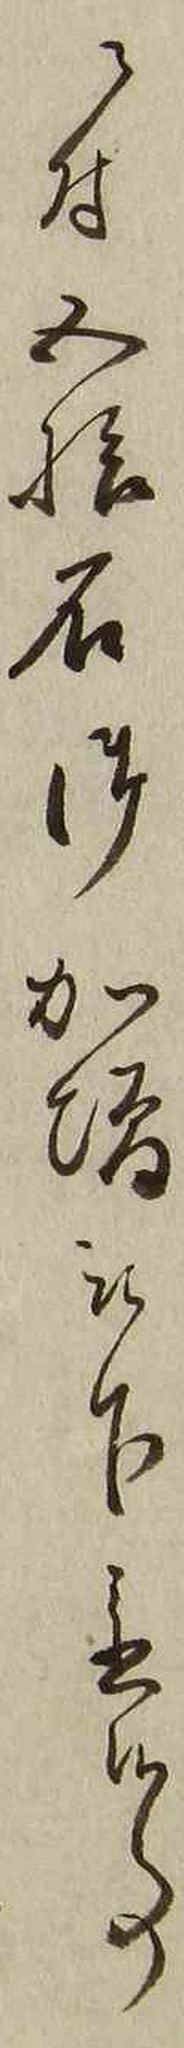に付五拾石御加増被下置候事
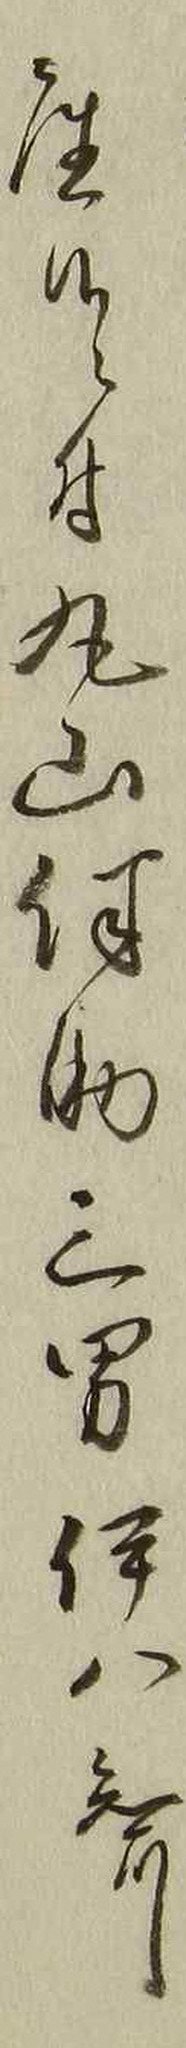産候に付丸山伴助三男伊八聟
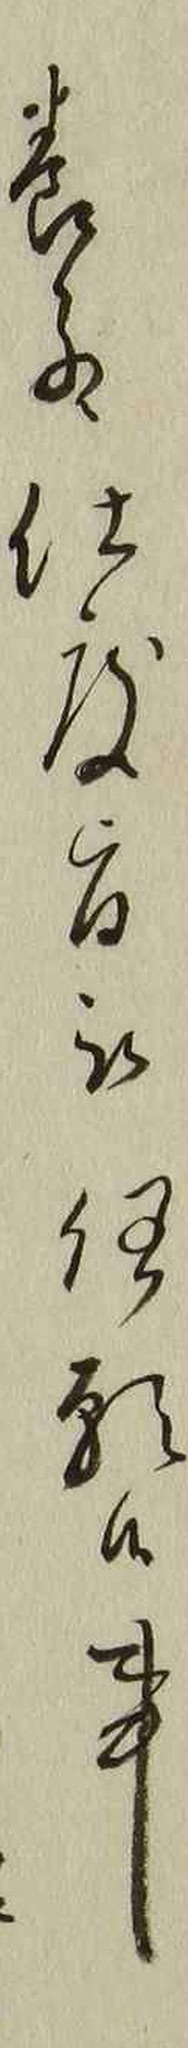養子ニ仕度旨被任願候事
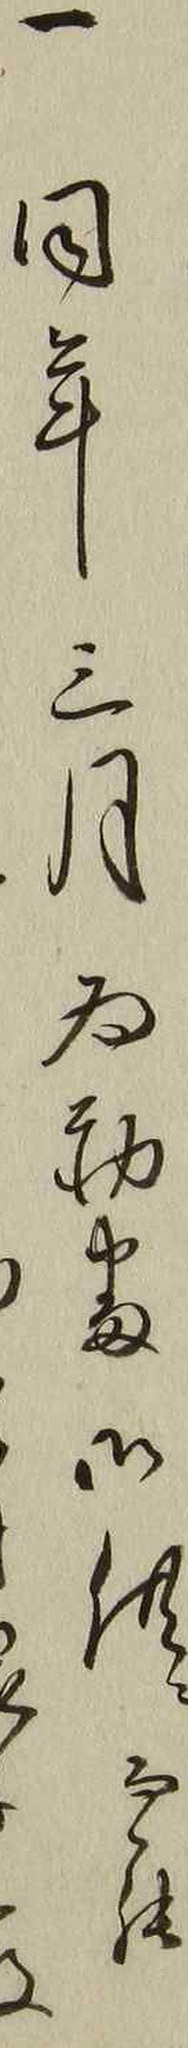一同年三月為勤番御供に而罷
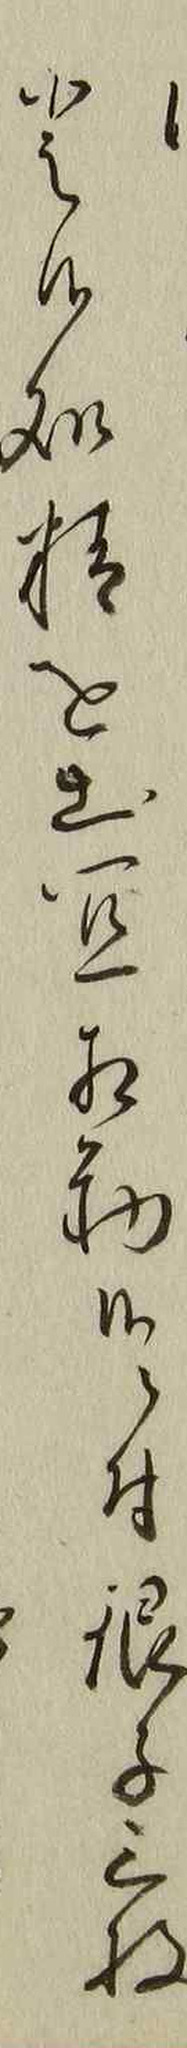登候処精を出宜相勤候に付銀子三枚
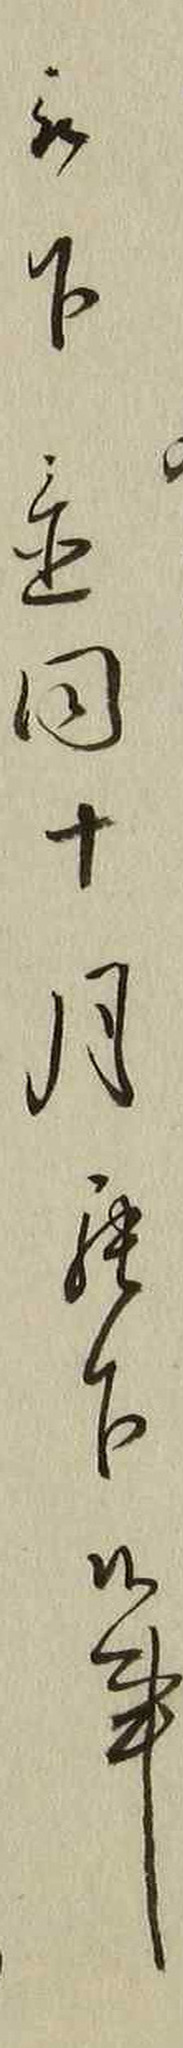被下置同十月罷下候事
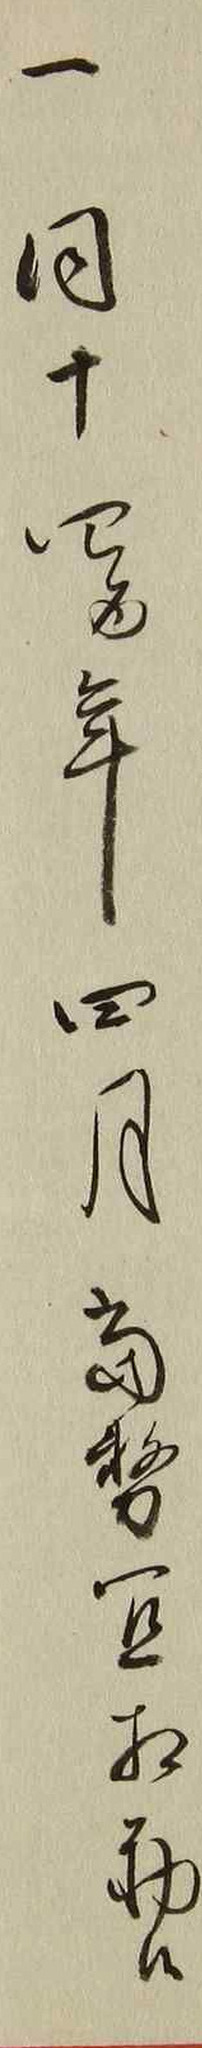一同十四酉年四月当務宜相勤候
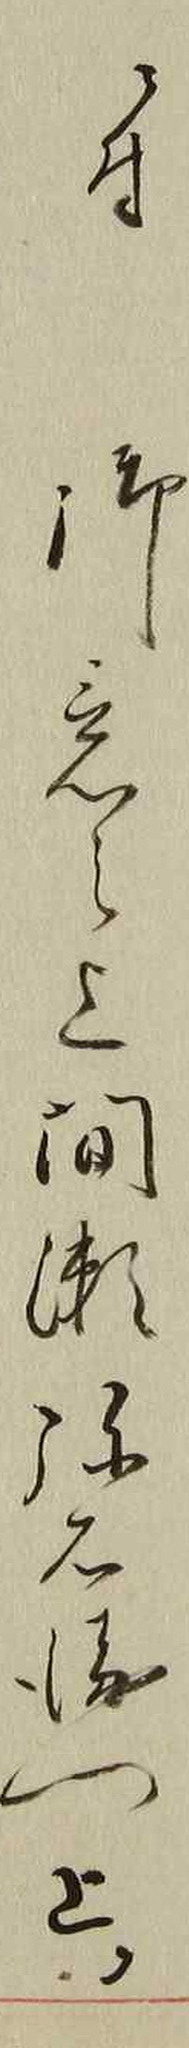に付御意之上間瀬弥右衛門上り
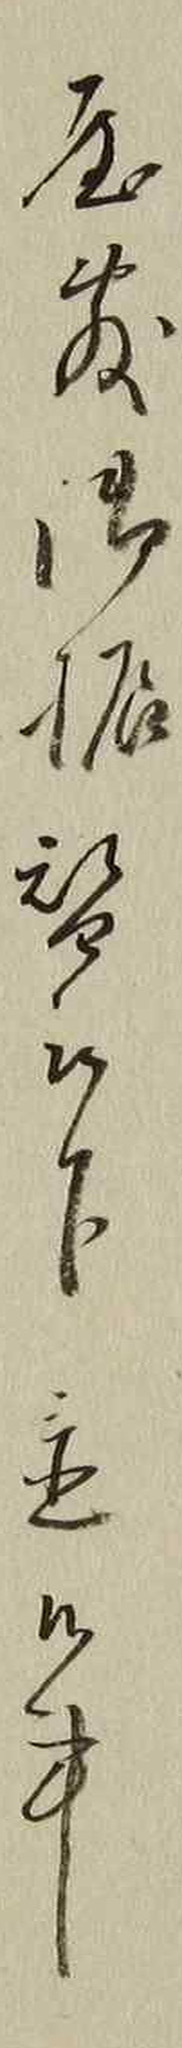屋敷御振替被下置候事
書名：諸士系譜　巻之6　い之部6
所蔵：会津若松市立会津図書館
